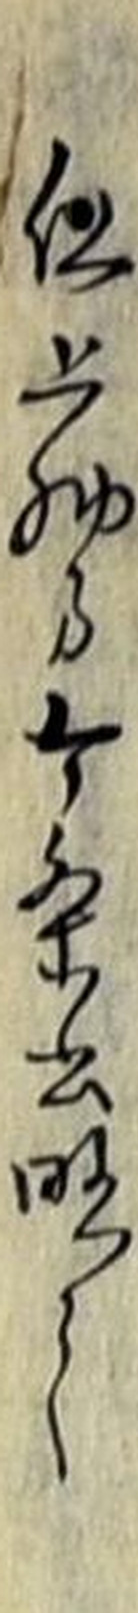但上納方ヶ条書略之
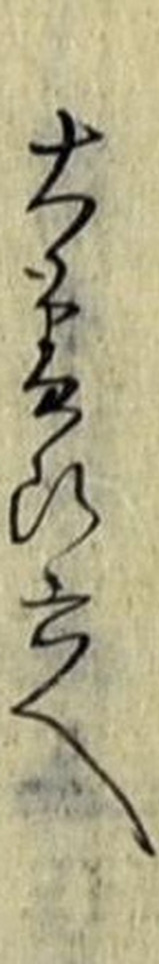大御番頭六人
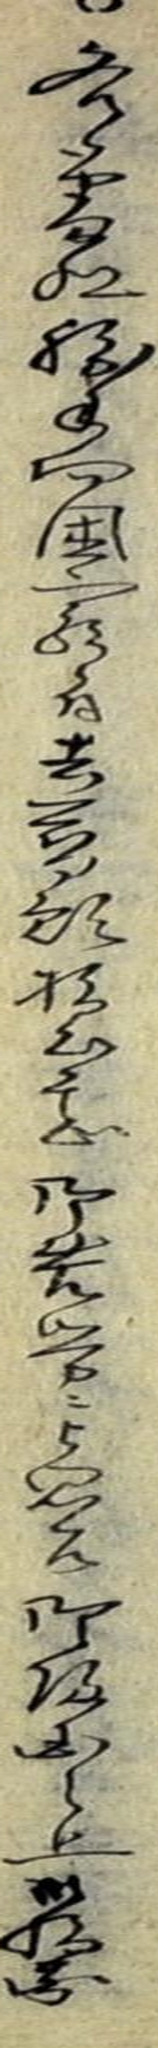○各御番組勝手向困窮に付去暮願指出甚御苦労に被思召御帰国之上御指図
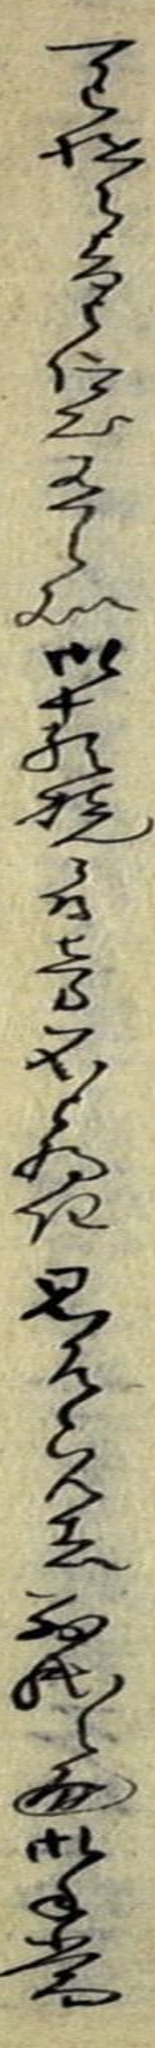可被遊旨被仰出有之処御類焼に付旁不被為任思召候乍去別紙之通御手当
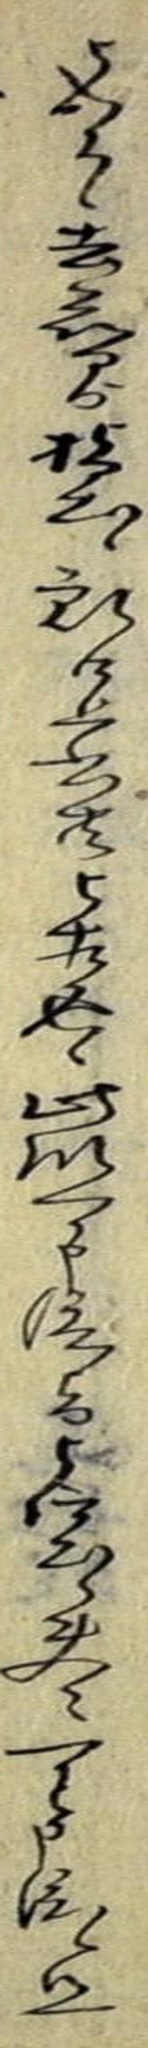被成下候去暮ゟ指出候願口上書共被相返候此段可申渡旨被仰出候夫々可申渡候且
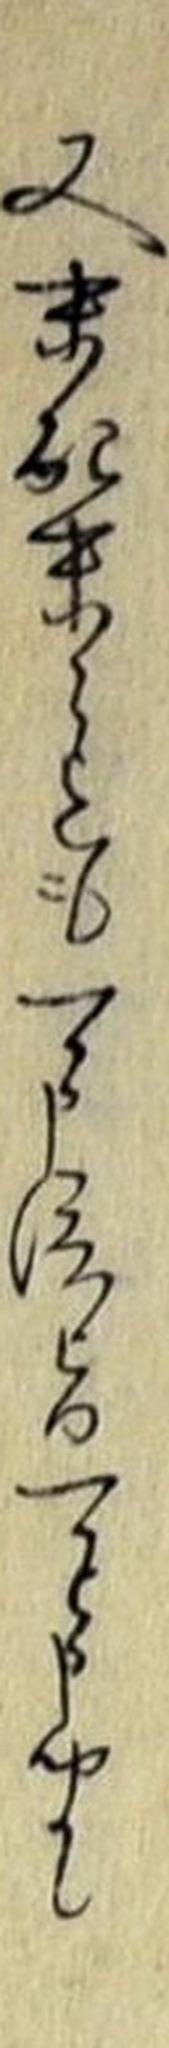又末配末々迄も可申渡旨可被申聞候
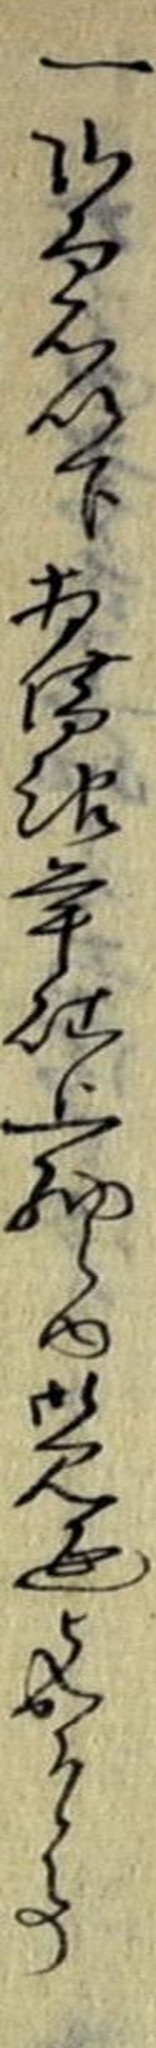一弐百石以下拝借銀年賦上納之内御見延被成下候事
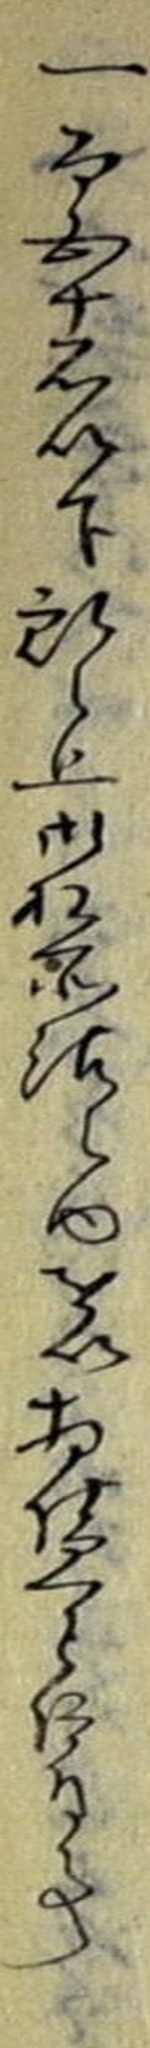一百五十石以下願之上御札所銀之内を以拝借可被仰付候事
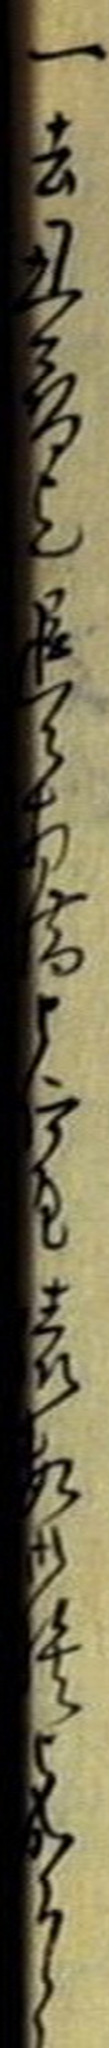一去丑暮迄追々拝借被仰付候俵数御捨被成下候事
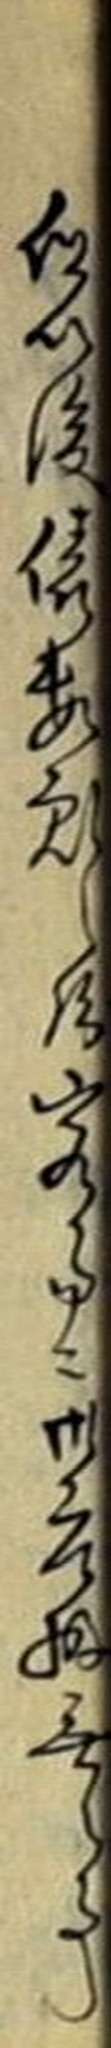但以後俵数願之儀定事に御取扱無之事
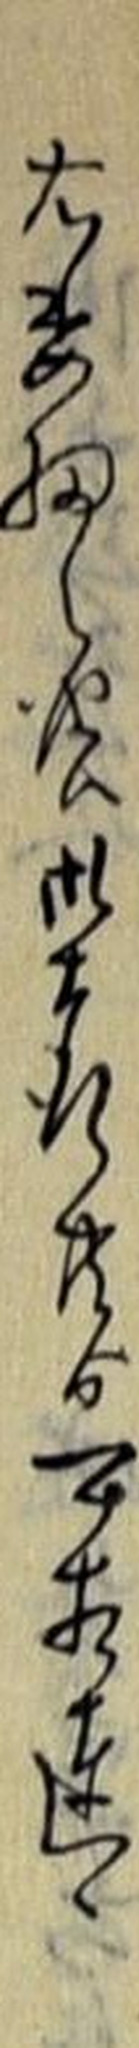右委細之儀は御奉行共ゟ可相達候
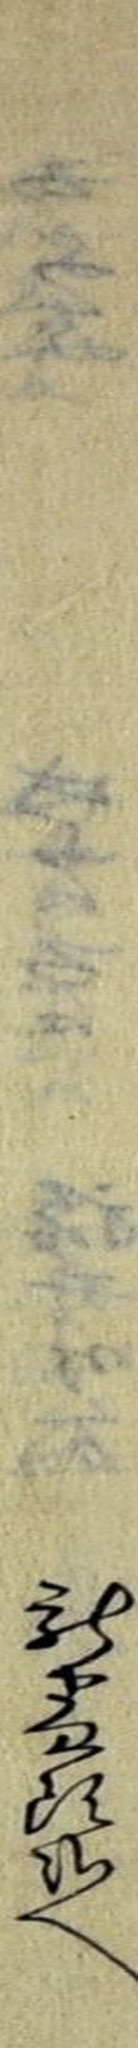新番頭弐人
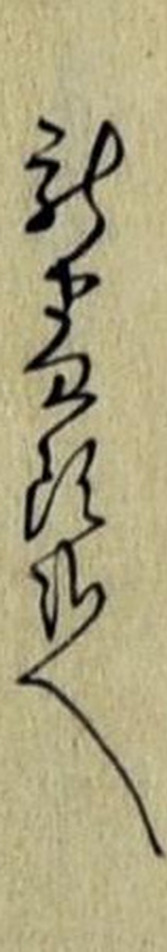新番頭弐人
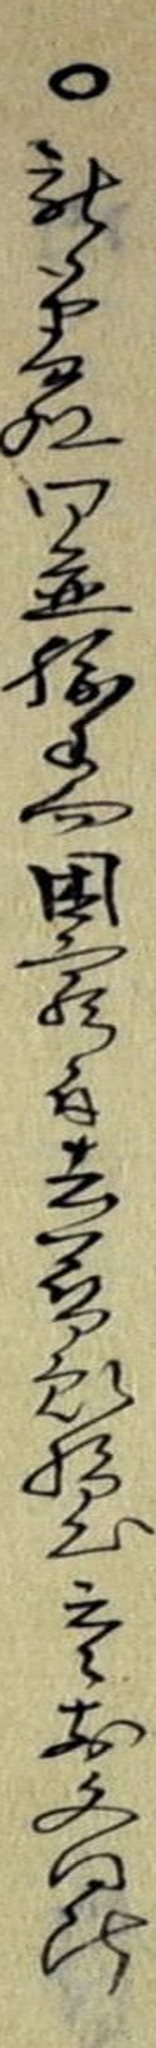○新御番組同並勝手向困窮に付去暮願指出云々前文同断
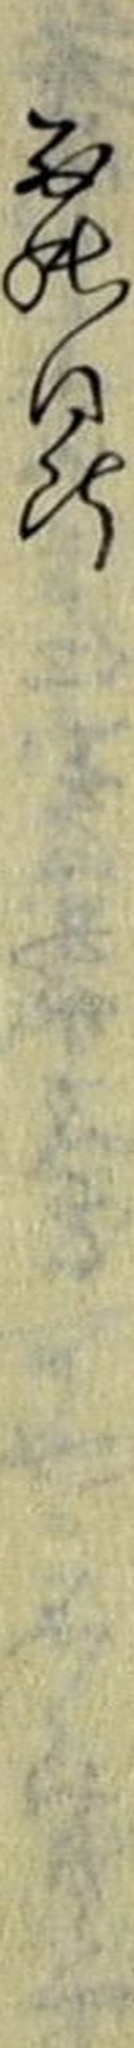別紙同断
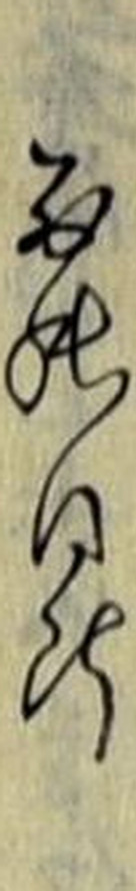別紙同断
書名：命令之部 四
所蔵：福井県文書館 Fukui Prefectural Archives
